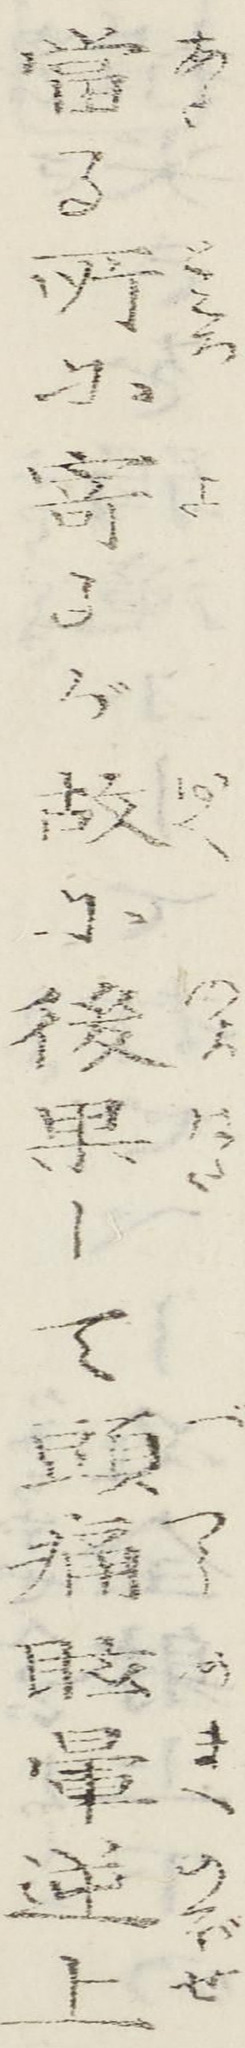当る所に寄るが故に後果して頭痛眩暈逆上
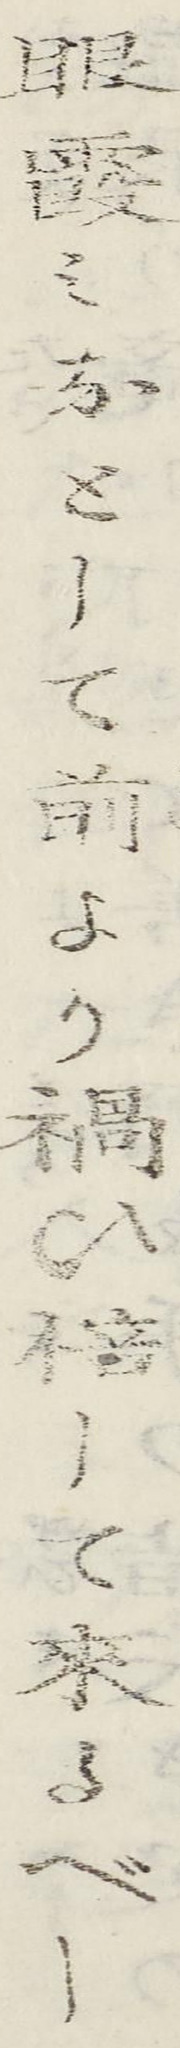眼霞みなとして前より禍ひ倍して来るべし
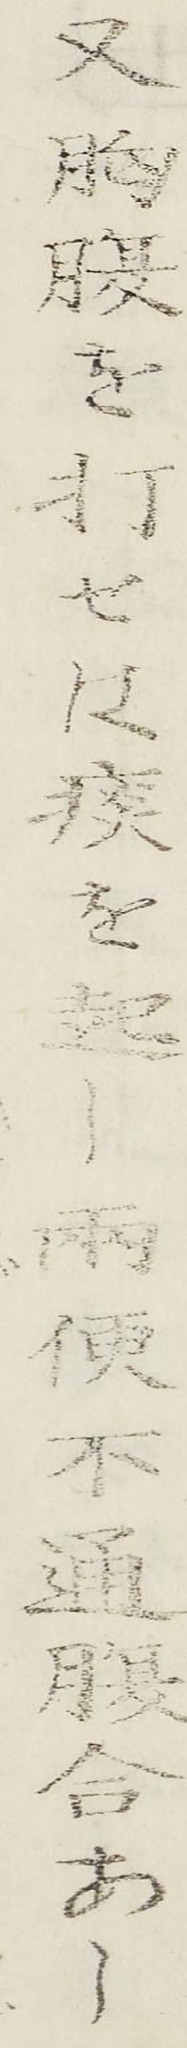又胸腹を打せは痰を起し両便不通腹合あし
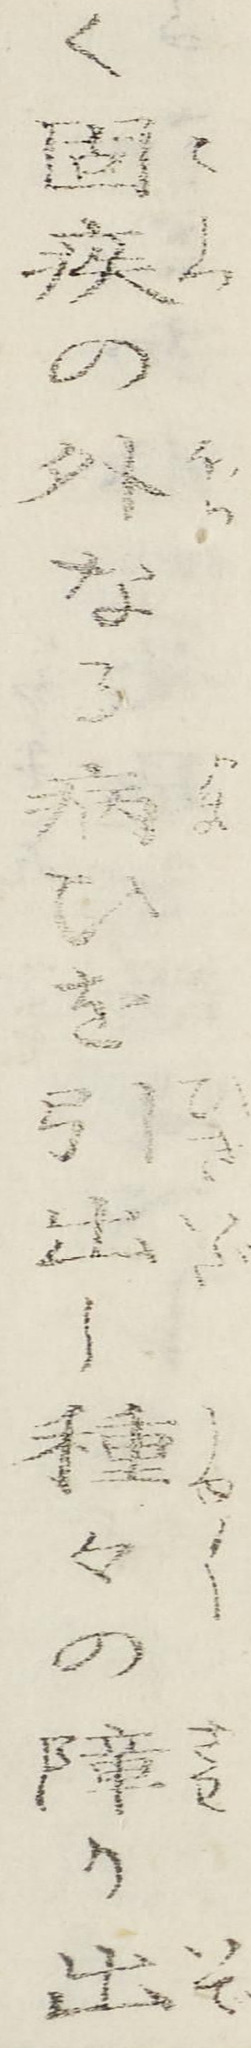く固疾の外なる病ひを引出し種々の障り出

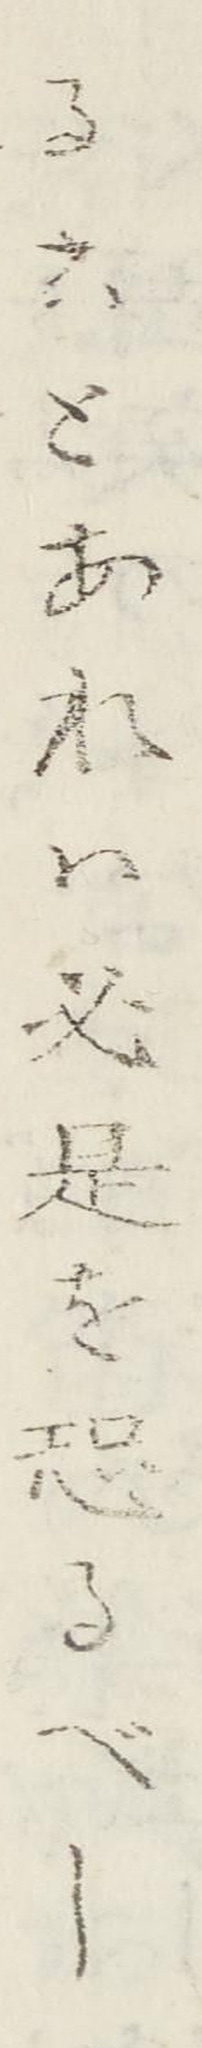ることあれは必是を恐るべし
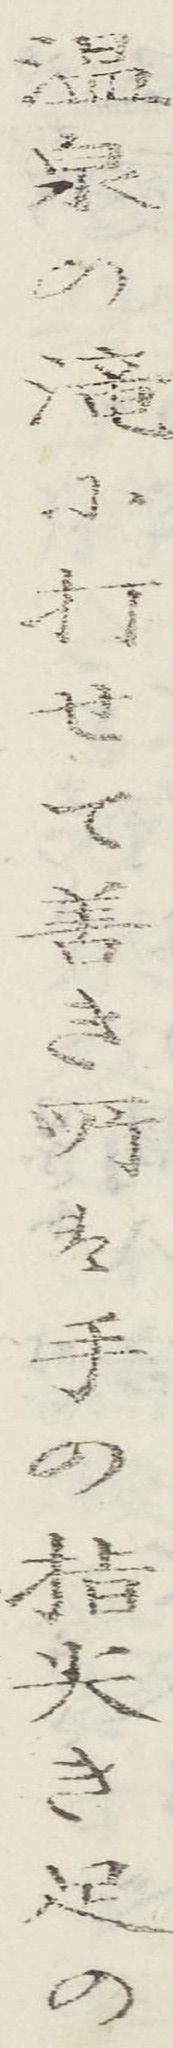温泉の滝に打せて善き所は手の指尖き足の
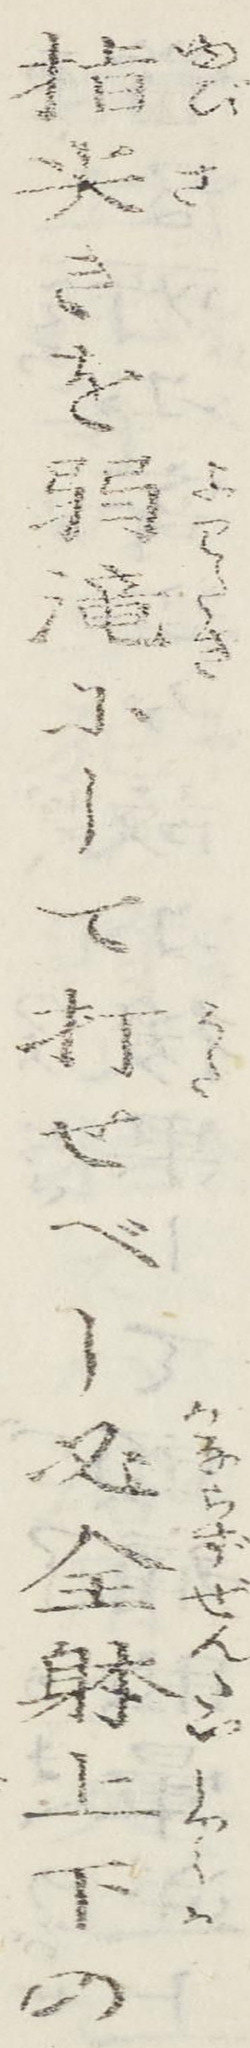指尖きを弱滝にして打せべし必全体上下の
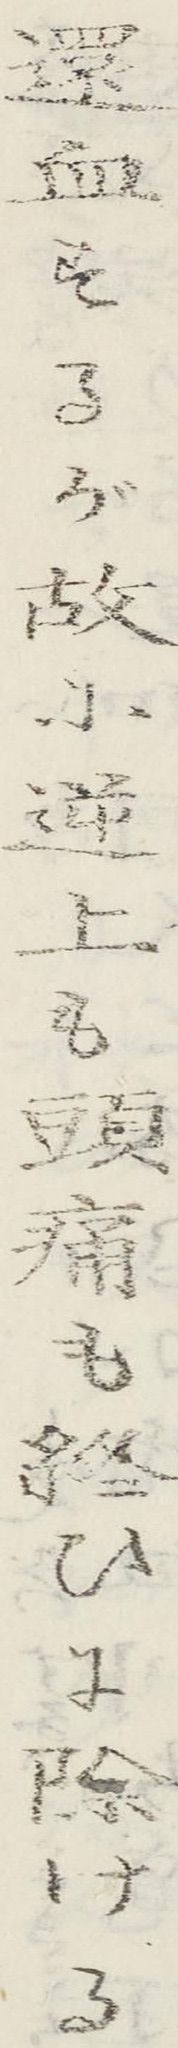還血するが故に逆上も頭痛も終ひに除ける
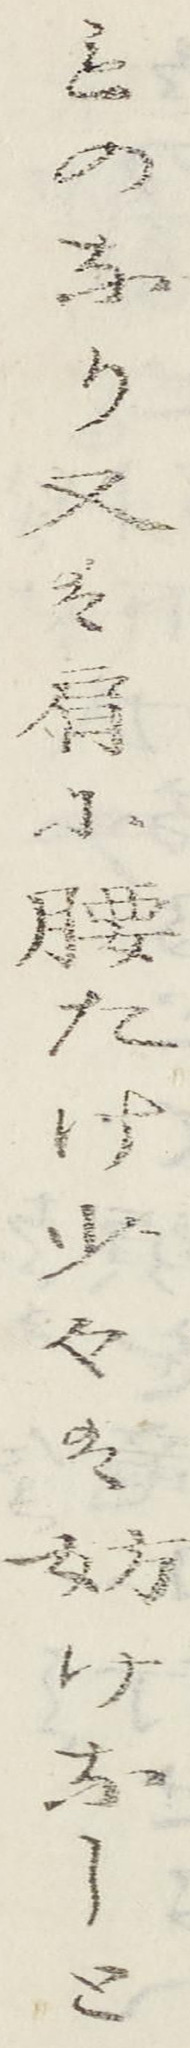ことのなり又は肩に腰たけ少々は妨けなしと
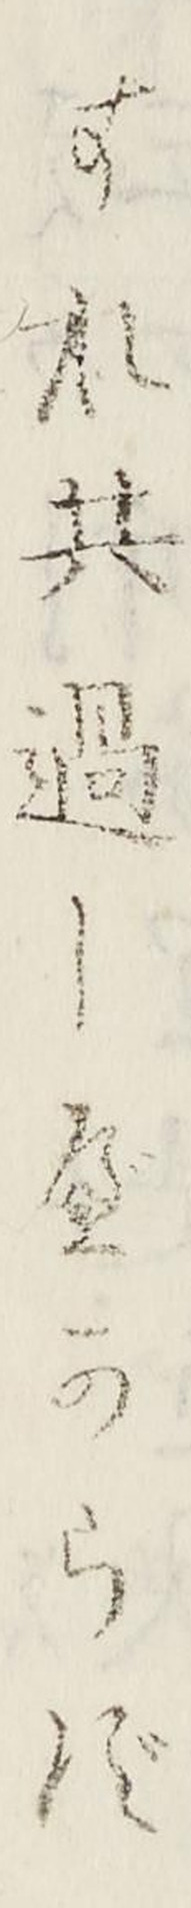すれ共過しべからず
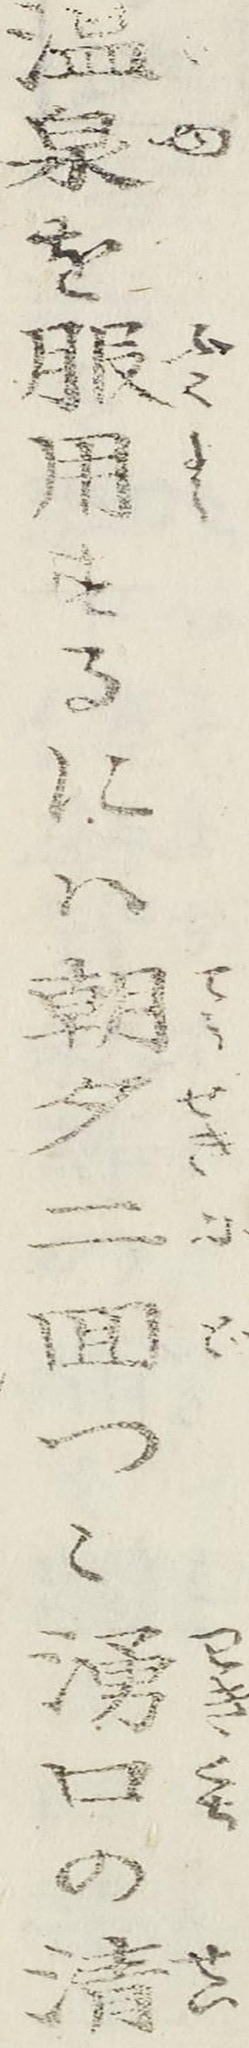温泉を服用するには朝夕二回つゝ湧口の清
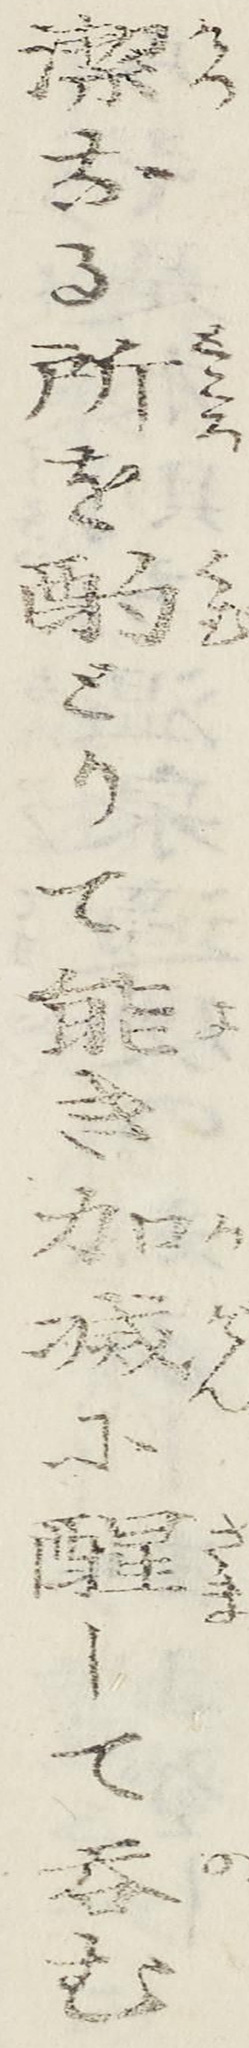潔なる所を酌とりて能き加減に醒して呑む
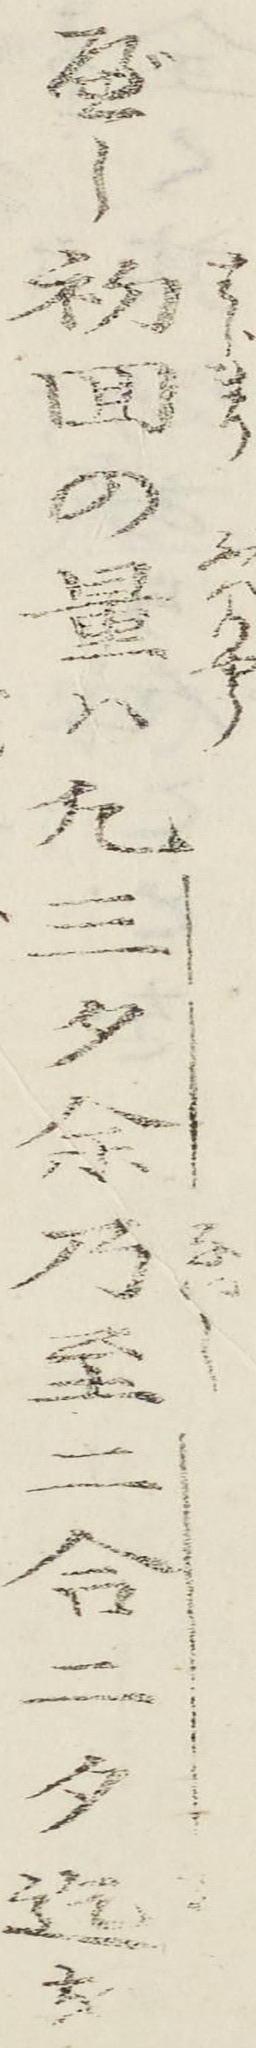べし初回の量は凡三夕余乃至ニ合二夕迄を
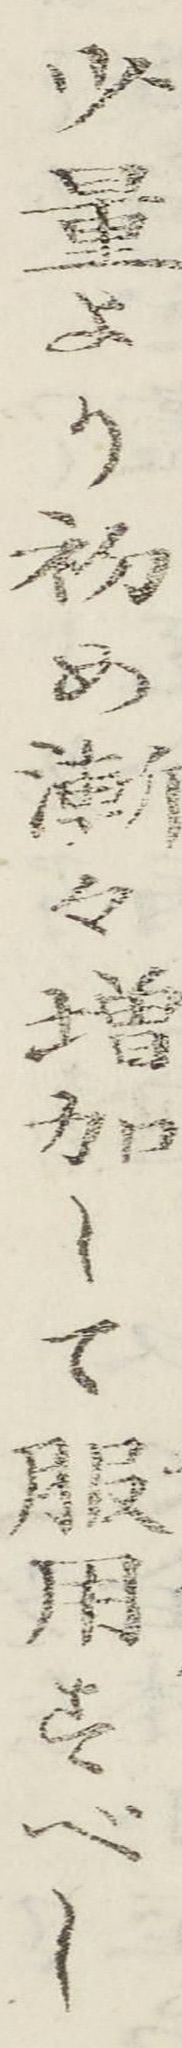少量より初め漸々増加して服用すべし
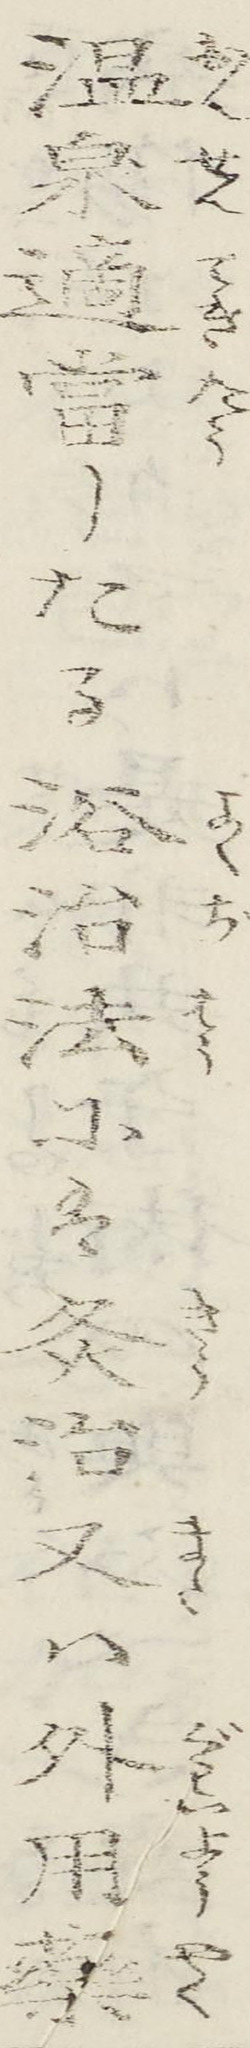温泉適当したる浴治法には灸治又は外用薬
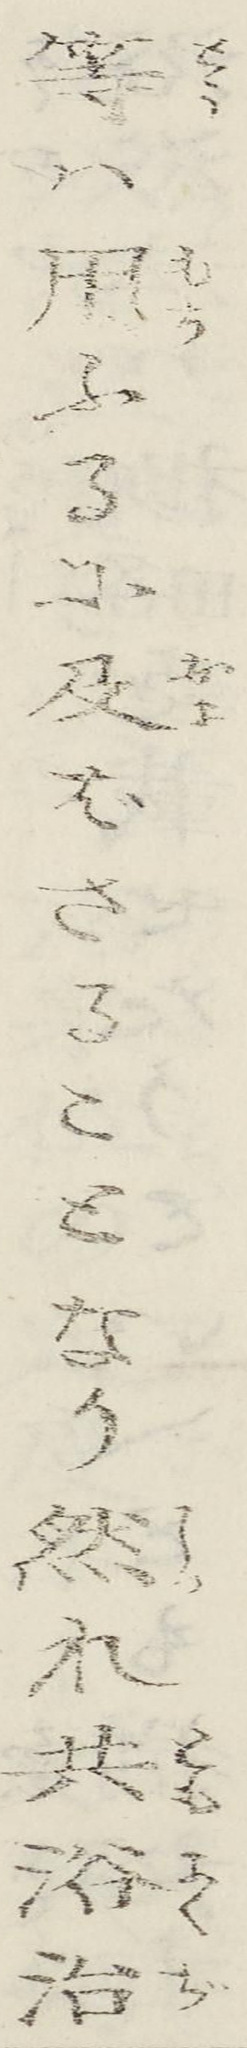等は用ふるに及ばさることなり然れ共浴治
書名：鎌先温泉由來記
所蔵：東京大学地震研究所図書室 Earthquake Research Institute Library, The University of Tokyo, JAPAN
